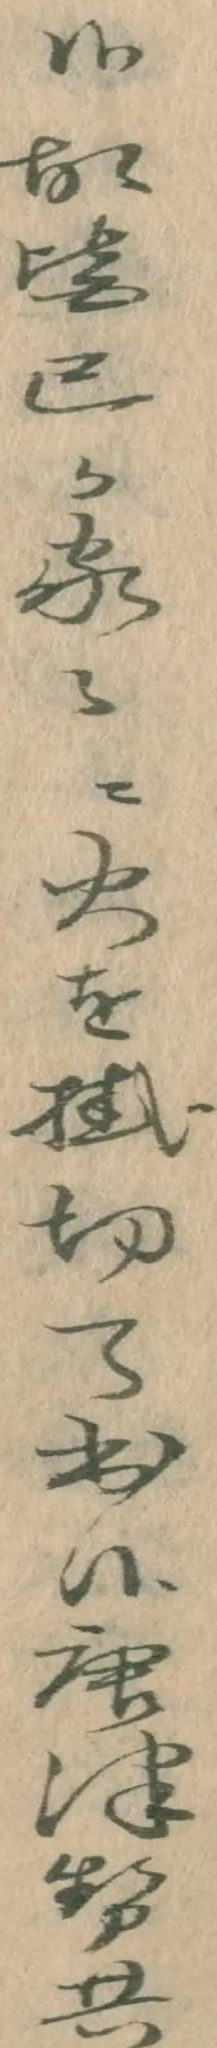候故皆已か家々に火を掛切て出候唐津勢共
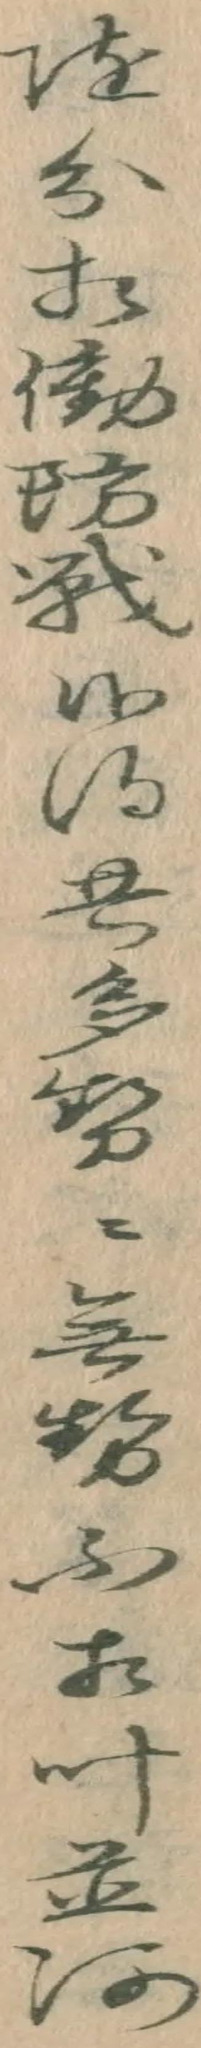随分相働防戦候得共多勢に無勢不相叶並河
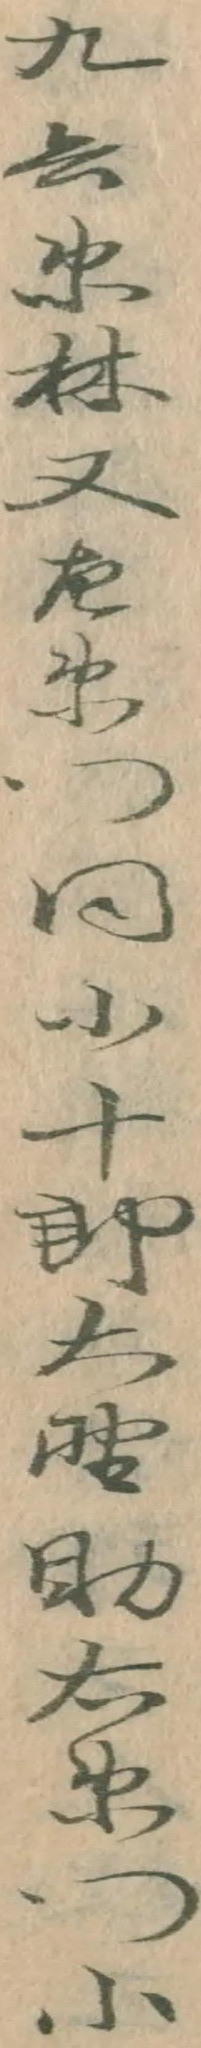九兵衛林又左衛門同小十郎大野助右衛門小
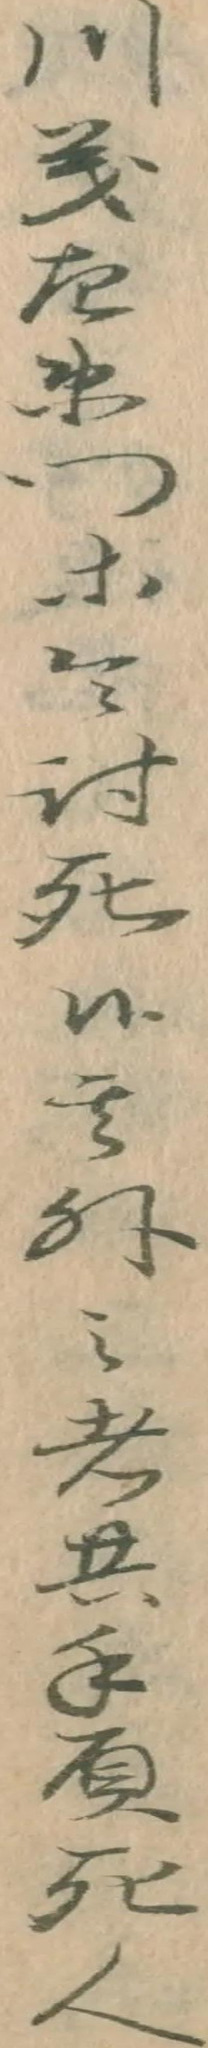川義左衛門等令討死候其外之者共手負死人

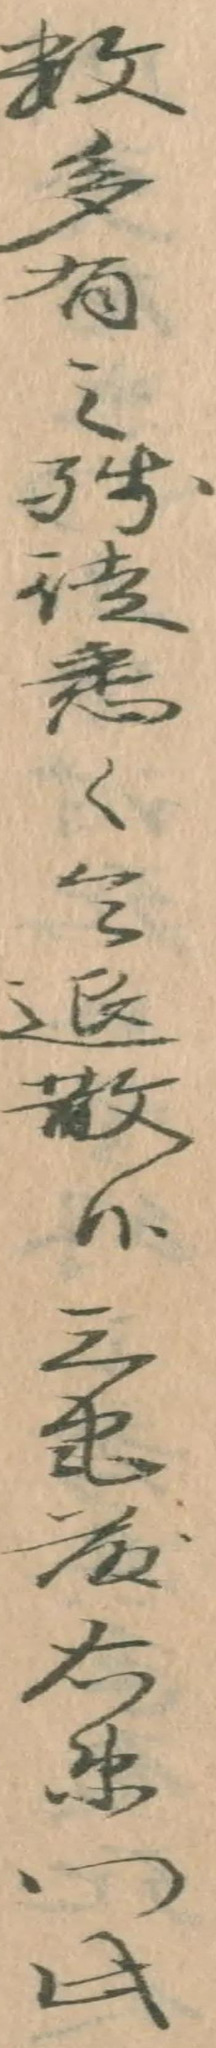数多有之残徒悉く令退散候三宅藤右衛門此
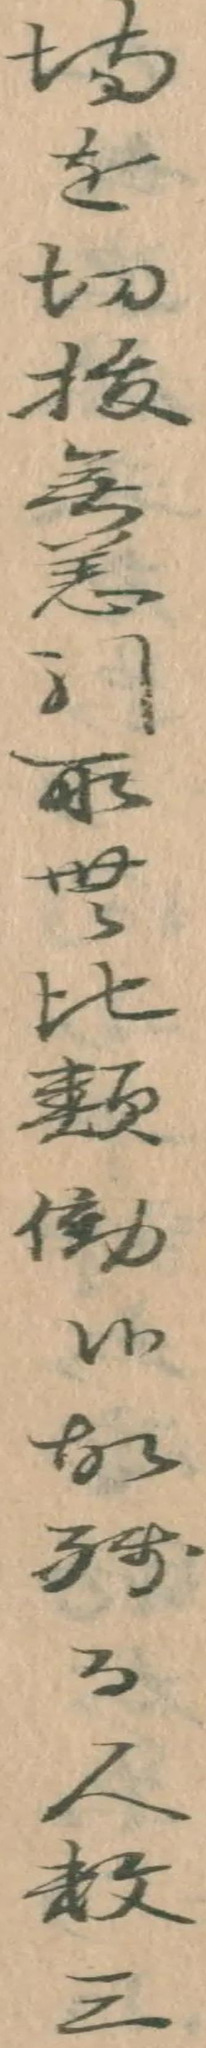場を切抜無恙引取無比類働候故残る人数三
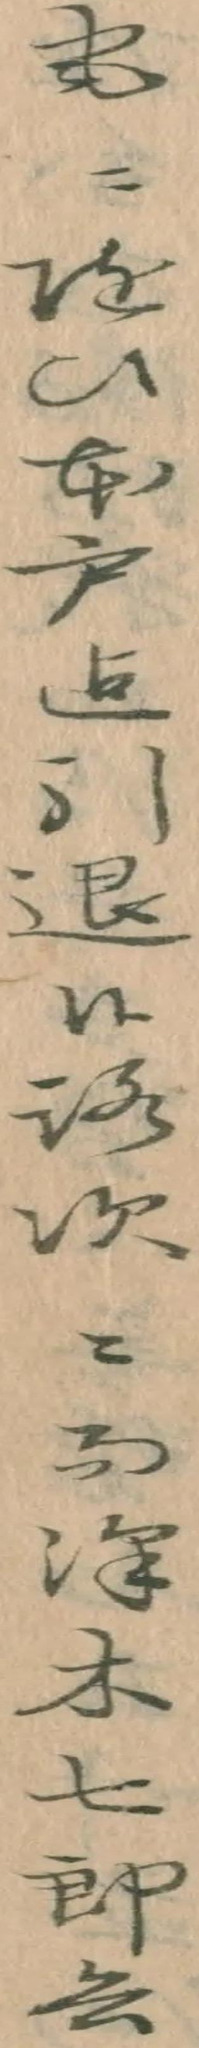宅に随ひ本戸迄引退候路次に而沢木七郎兵
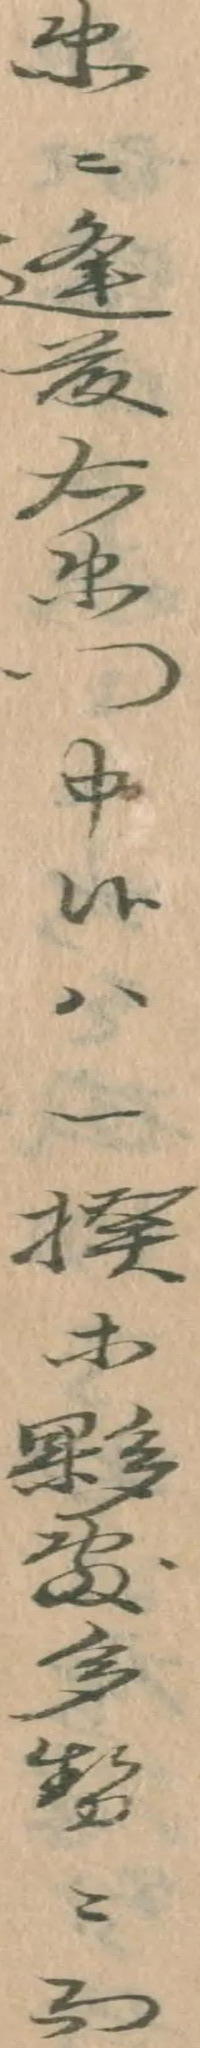衛に逢藤右衛門申候は一揆等夥敷多勢に而
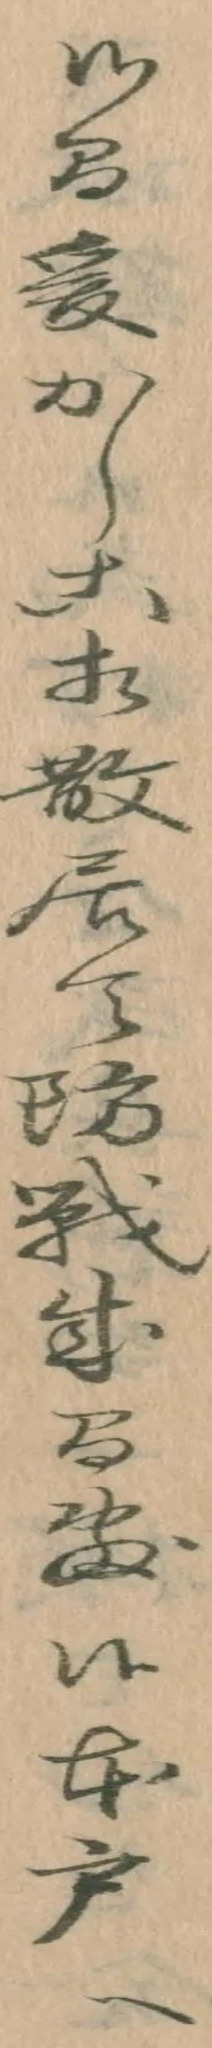候間爰かし古相散居て防戦成間敷候本戸へ
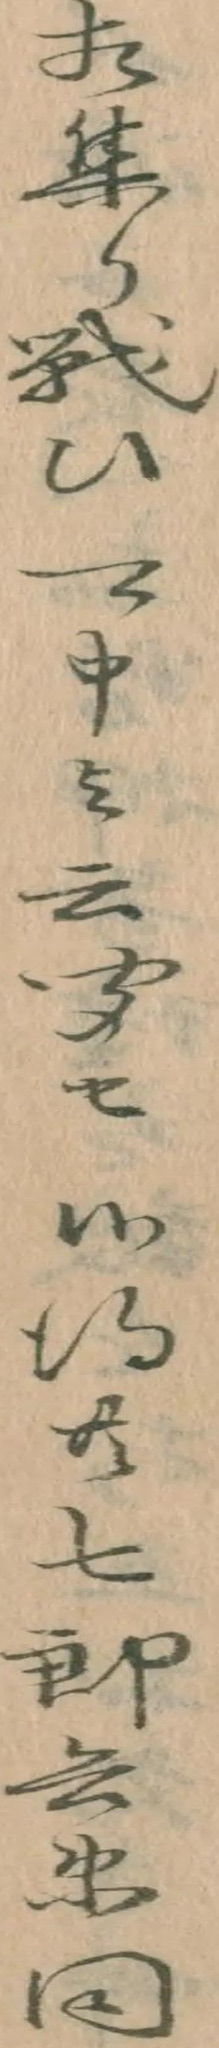相集り戦ひ可申与云聞せ候得共七郎兵衛同
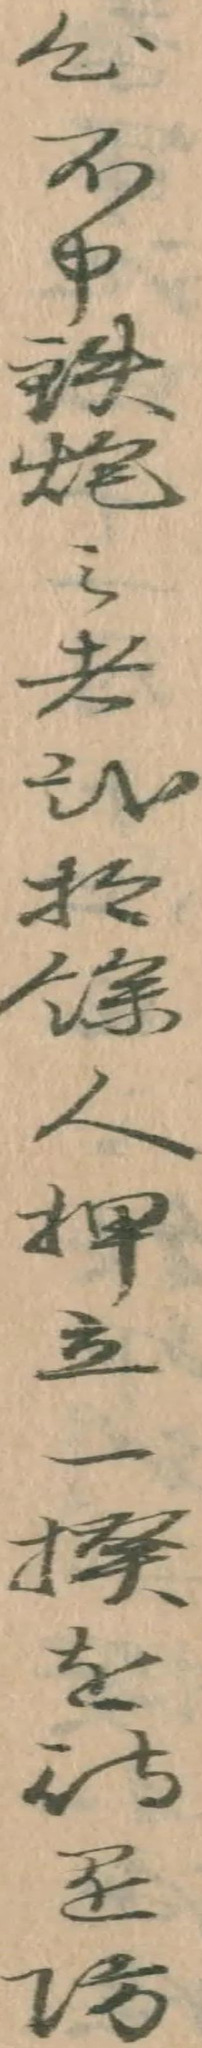心不申鉄炮之者弐拾余人押立一揆を待懸防
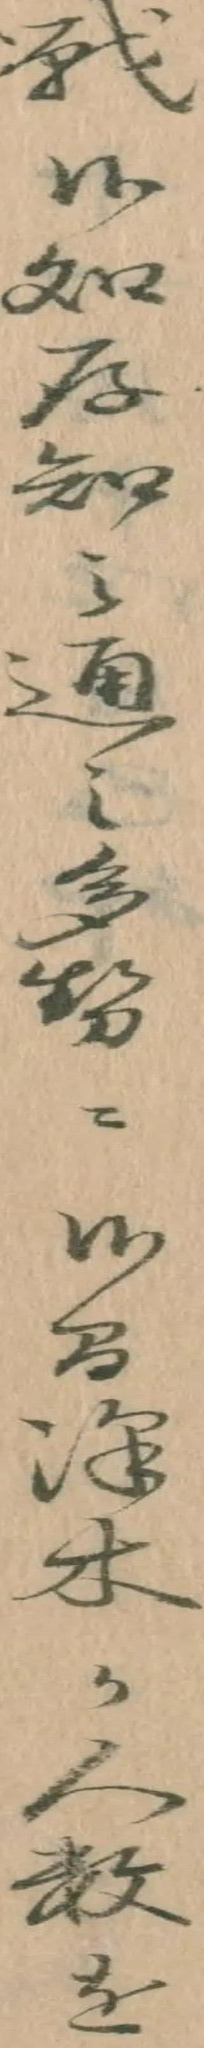戦候処存知之通之多勢に候間沢木か人数を
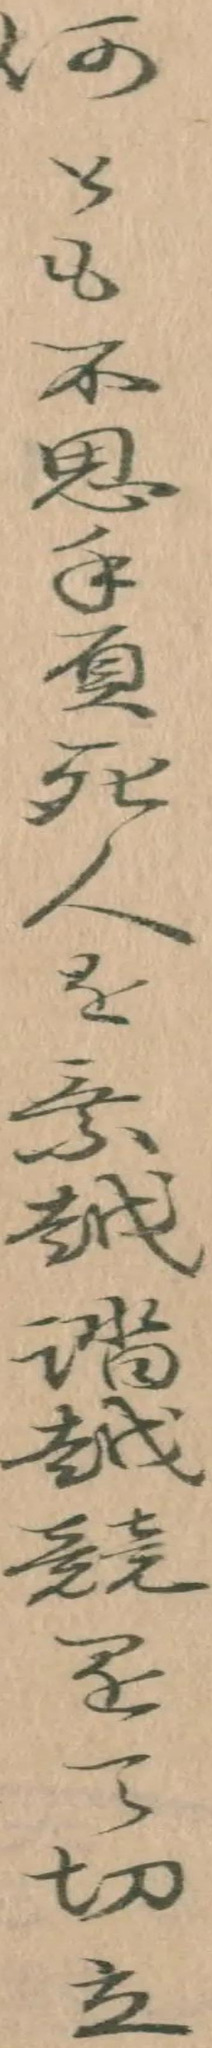何とも不思手負死人を乗越踏越競懸て切立
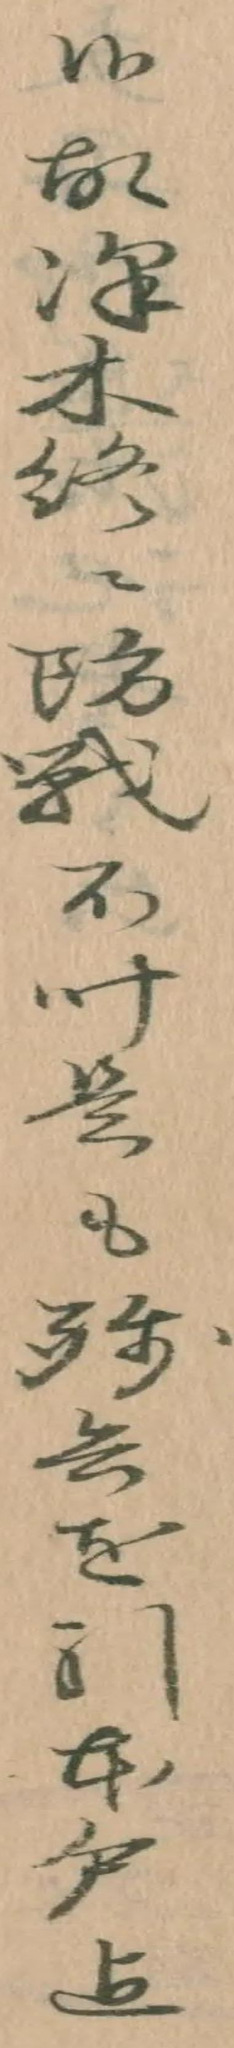候故沢木終に防戦不叶是も残兵を引本戸迄
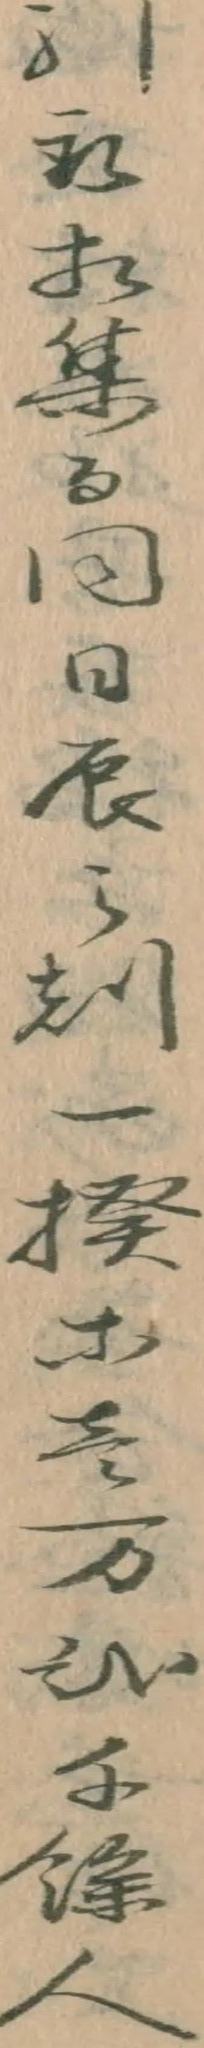引取相集而同日辰之刻一揆等壱万弐千余人
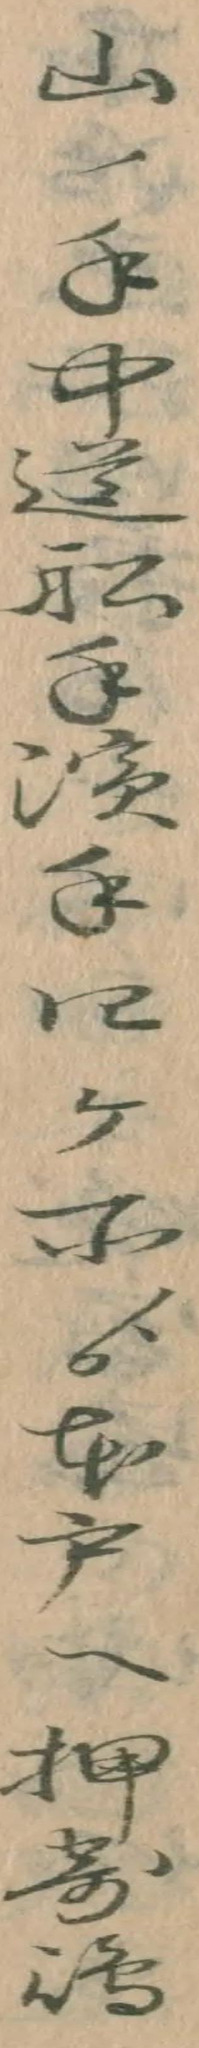山之手中道舩手浜手四け所ゟ本戸へ押寄島
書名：切支丹御退治記 49巻. [2]
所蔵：国立国会図書館 National Diet Library, JAPAN
